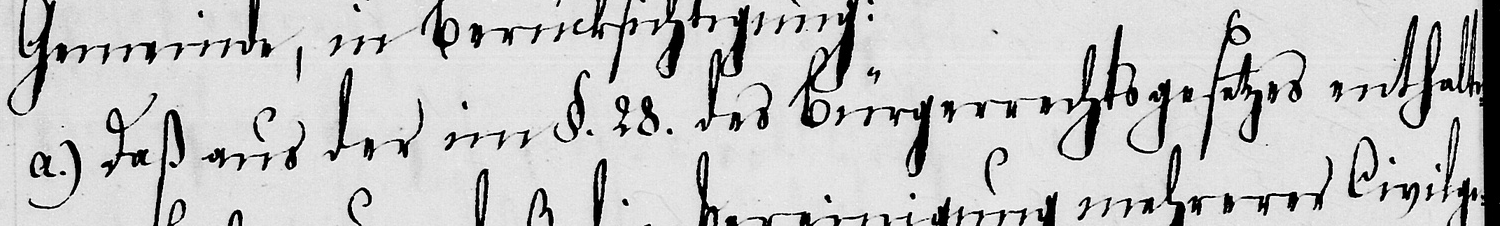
a.) Daß aus der im §. 28. des Bürgerrechtsgesetzes enthalt¬
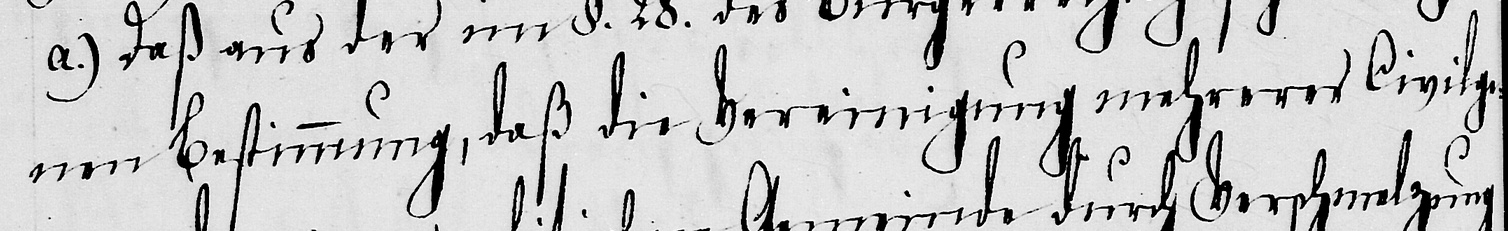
enen Bestimmung, daß die Vereinigung mehrerer Civilg¬
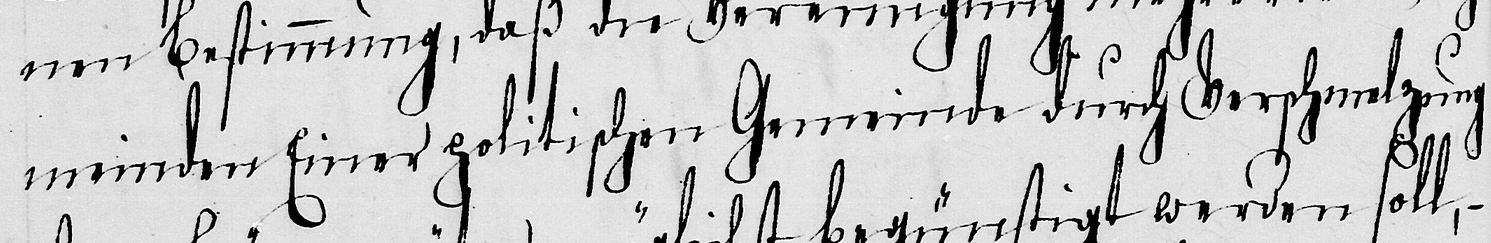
emeinden Einer politischen Gemeinde durch Verschmelzu¬
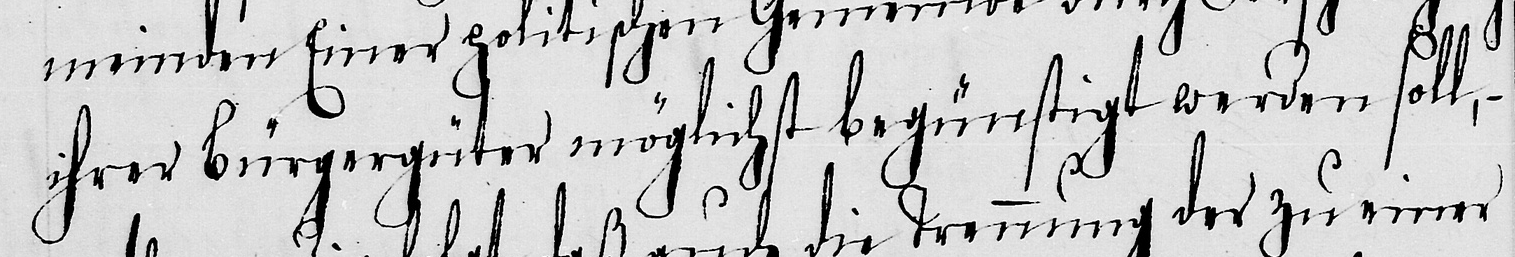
ihrer Bürgergüter möglichst begünstigt werden soll,
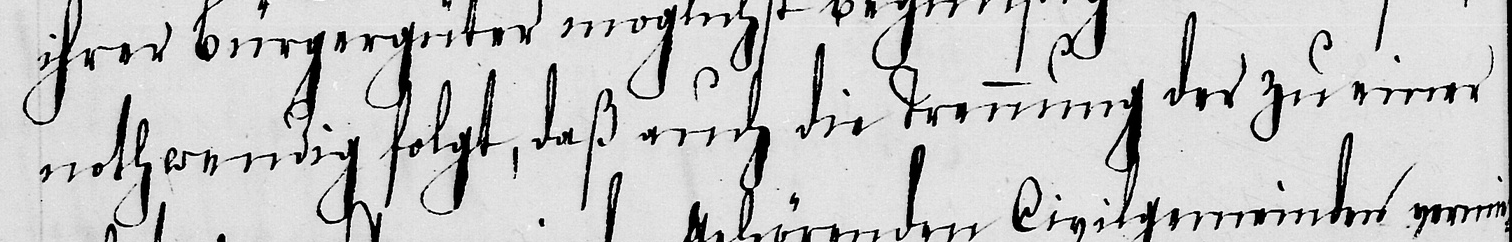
nothwendig folgt, daß auch die Trennung der zu einer
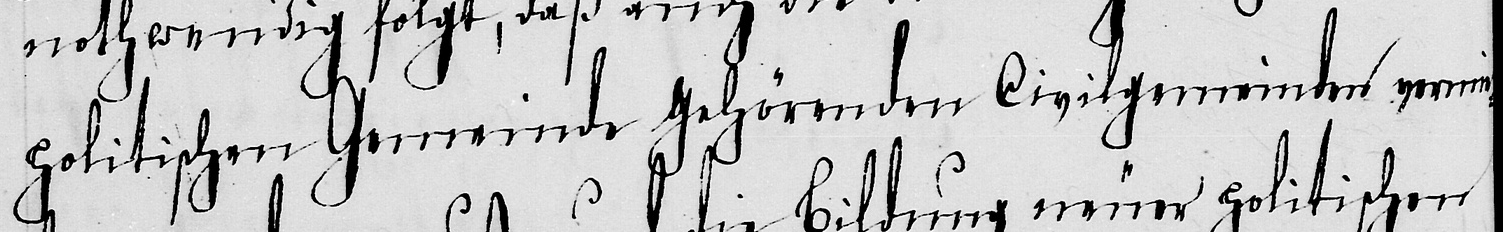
politischen Gemeinde gehörenden Civilgemeinden vermi¬
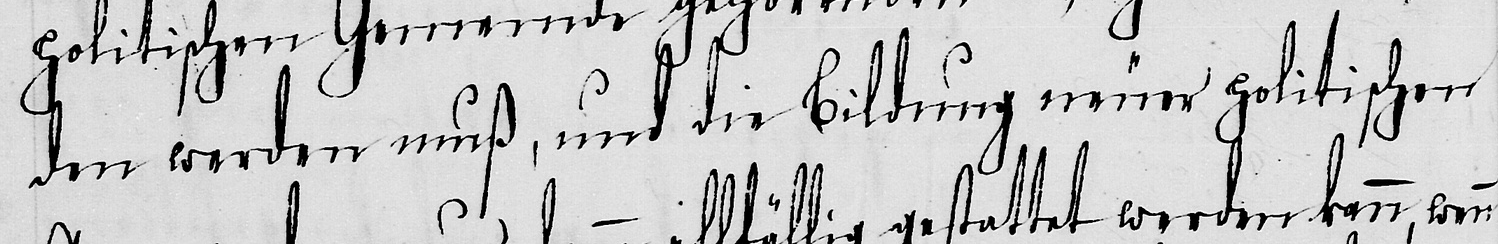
eden werden muß, und die Bildung neuer politischen
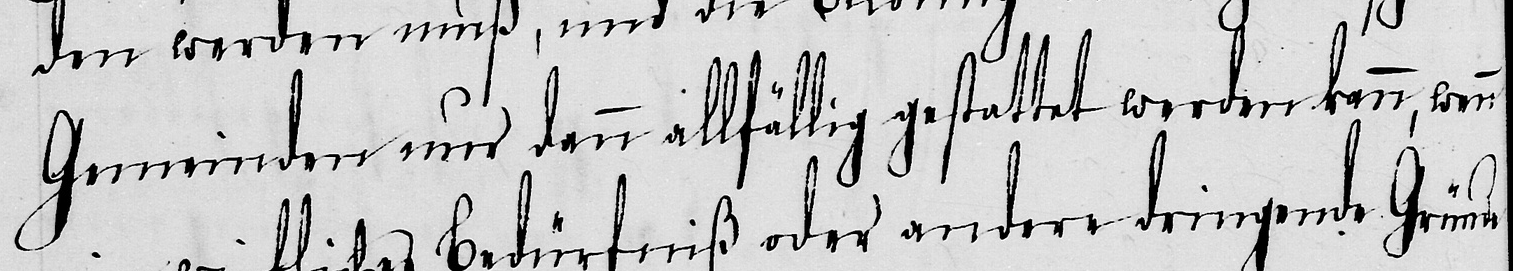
Gemeinden nur dann allfällig gestattet werden
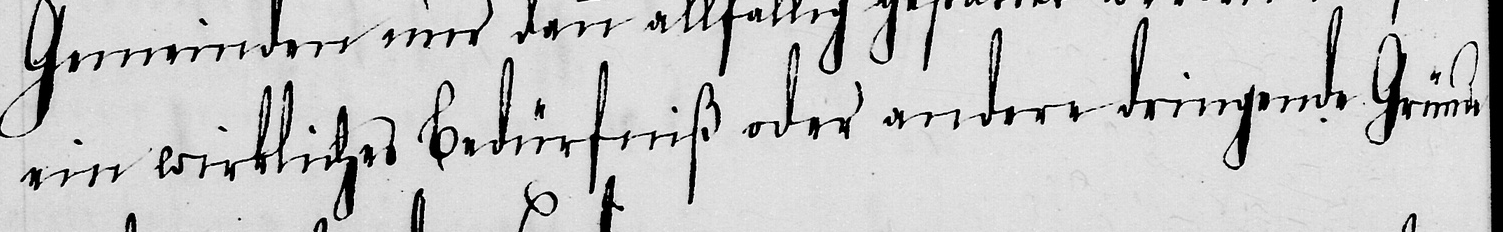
ein wirkliches Bedürfniß oder andere dringende Gründe
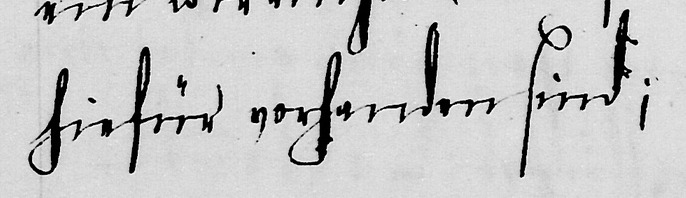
hiefür vorhanden sind;
